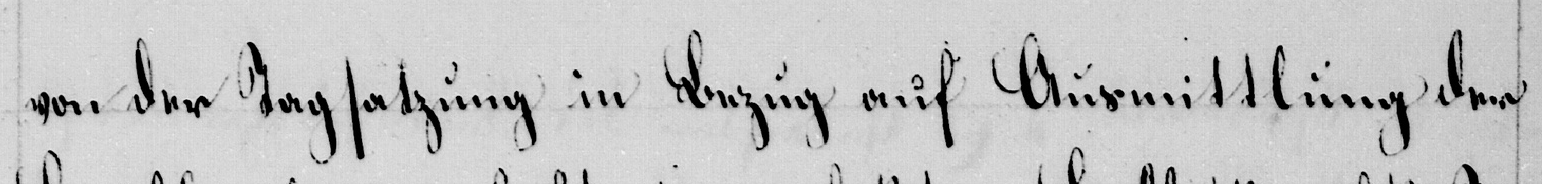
von der Tagsatzung in Bezug auf Ausmittlung der
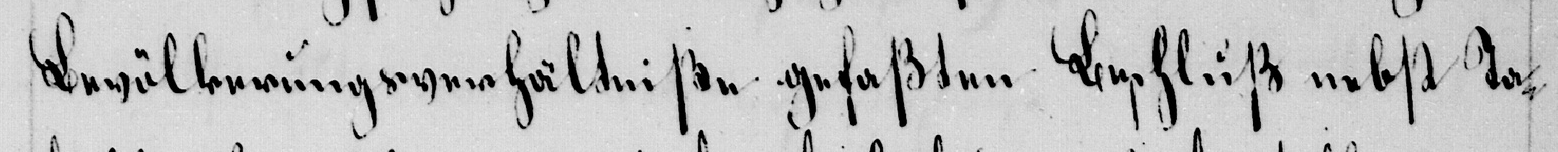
Bevölkerungsverhältniße gefaßten Beschluß nebst Ta¬
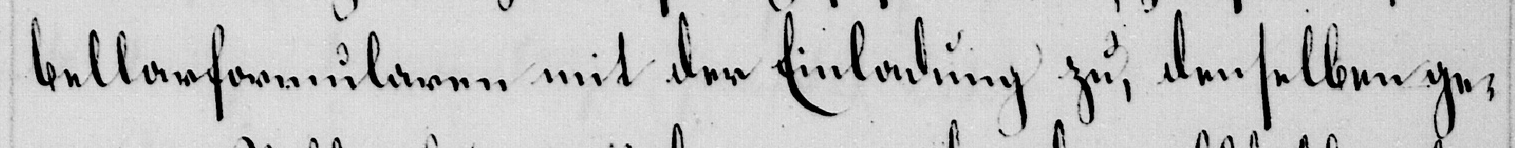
bellarformularen mit der Einladung zu, denselben ge¬
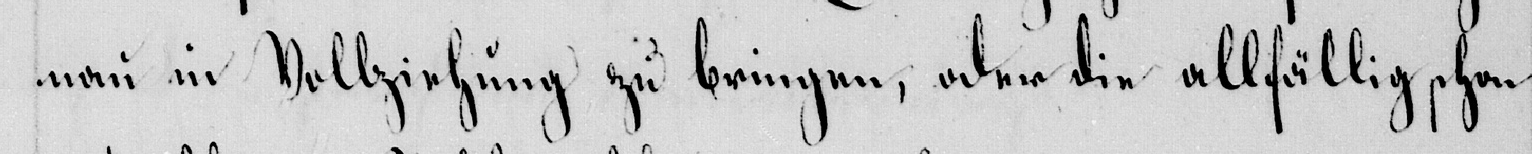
nau in Vollziehung zu bringen, oder die allfällig schon
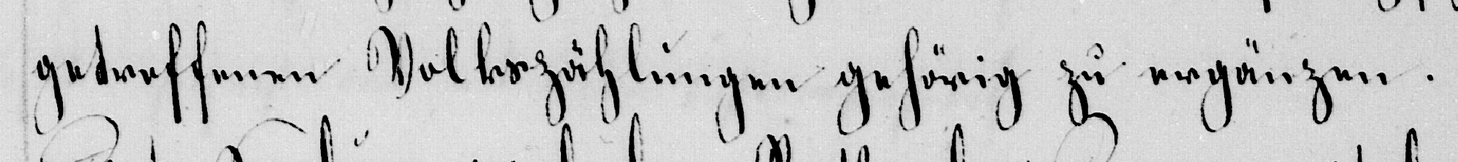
getroffenen Volkszählungen gehörig zu ergänzen.
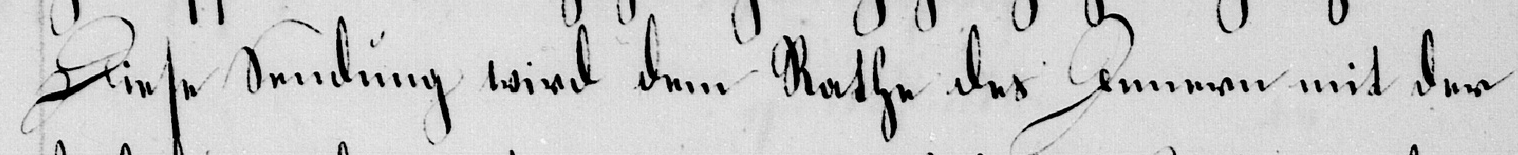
Diese Sendung wird dem Rathe des Innern mit der
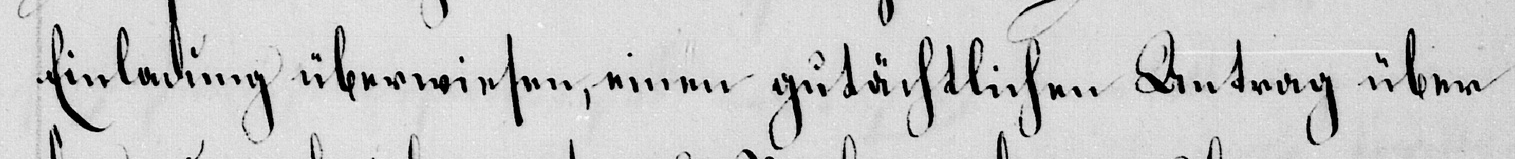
Einladung überwiesen, einen gutächtlichen Antrag über
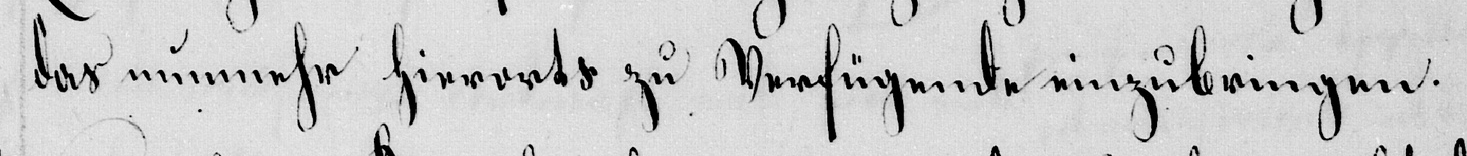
das nunmehr hierorts zu Verfügende einzubringen.
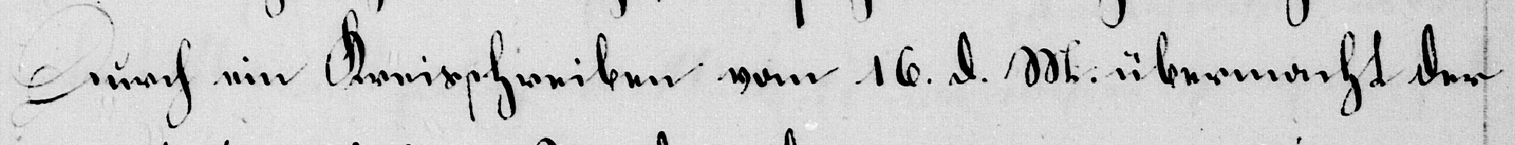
Durch ein Kreisschreiben vom 16. d. M. übermacht der
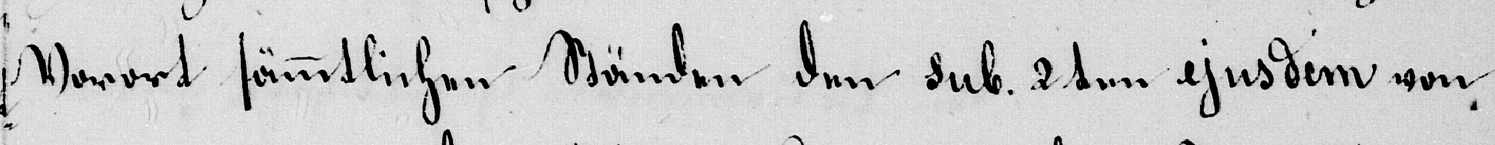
Vorort sämmtlichen Ständen den sub. 2ten ejusdem von
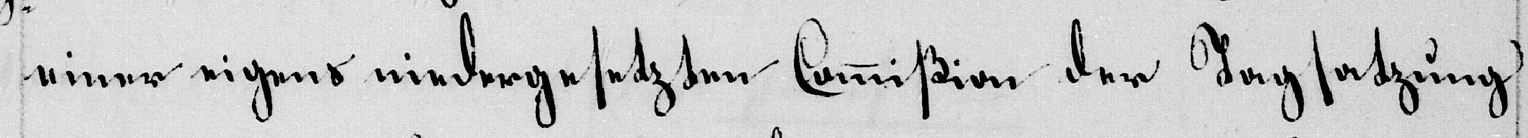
einer eigens niedergesetzten Commißion der Tagsatzung
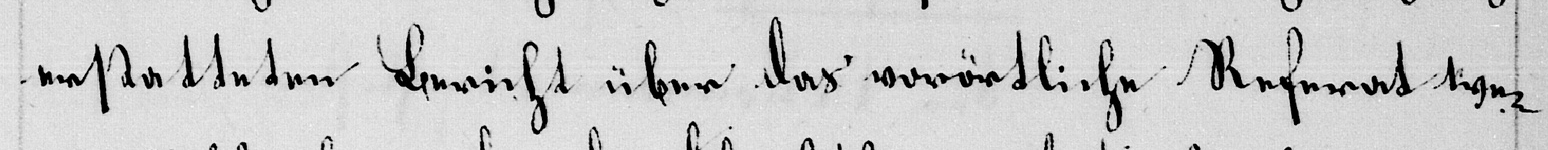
erstatteten Bericht über das vorörtliche Referat we¬
